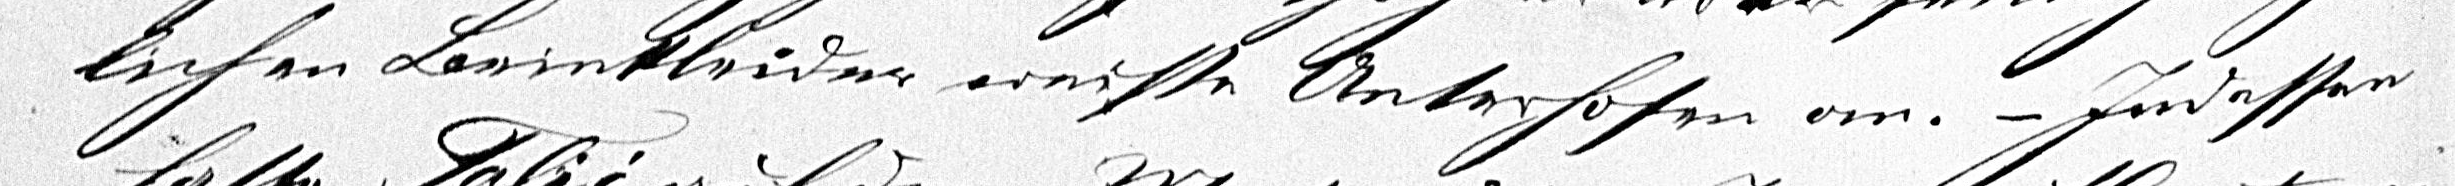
lichen Beinkleider weiße Unterhofen an. – Indessen
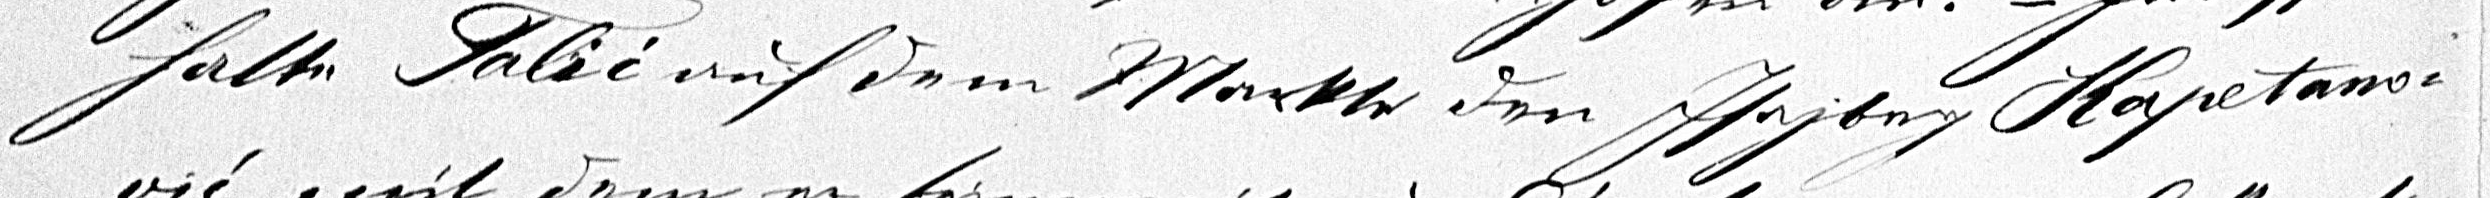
hatte Talić auf dem Markte den Isajbeg Kapetano¬
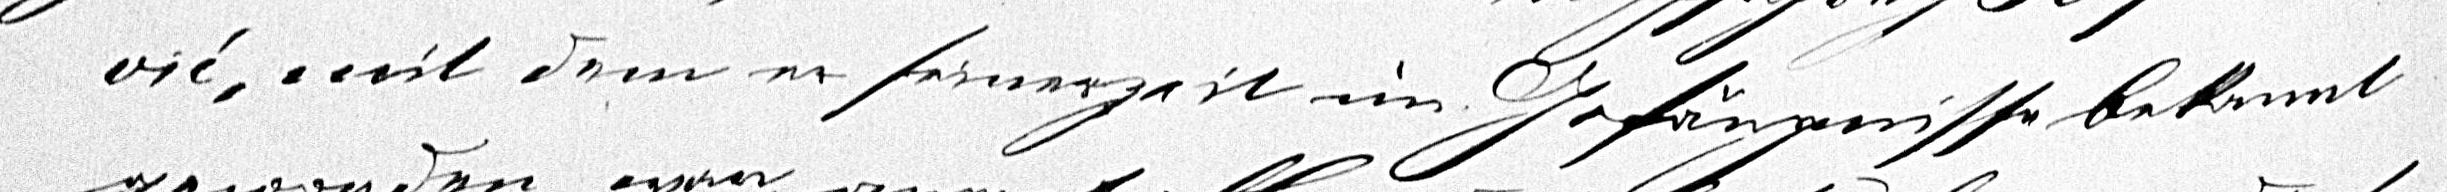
vić, mit dem er seinerzeit im Gefängnisse bekannt
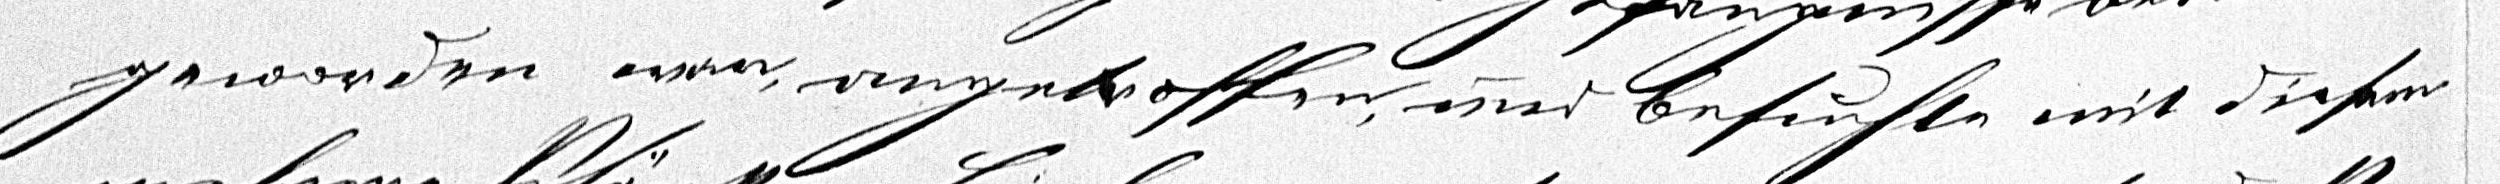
geworden war, angetroffen, und besuchte mit diesem
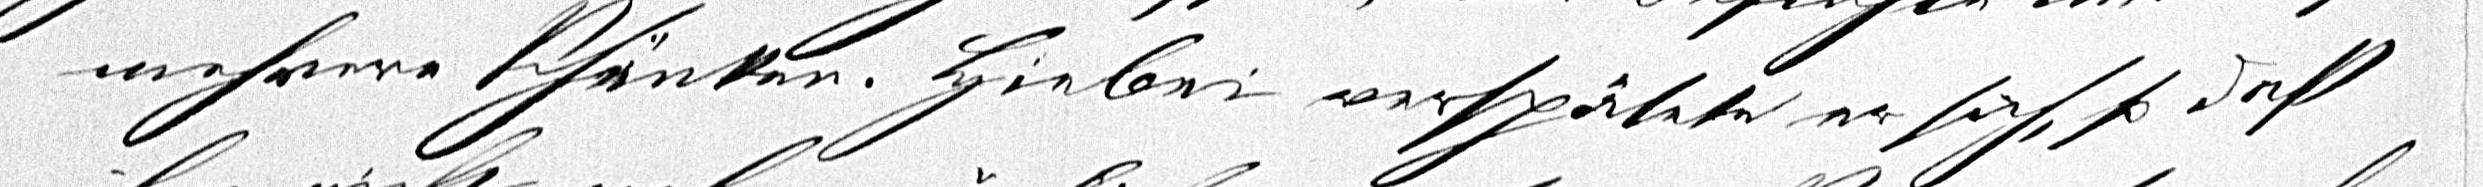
mehrere Schänken. Hiebei verspätete er sich, so daß
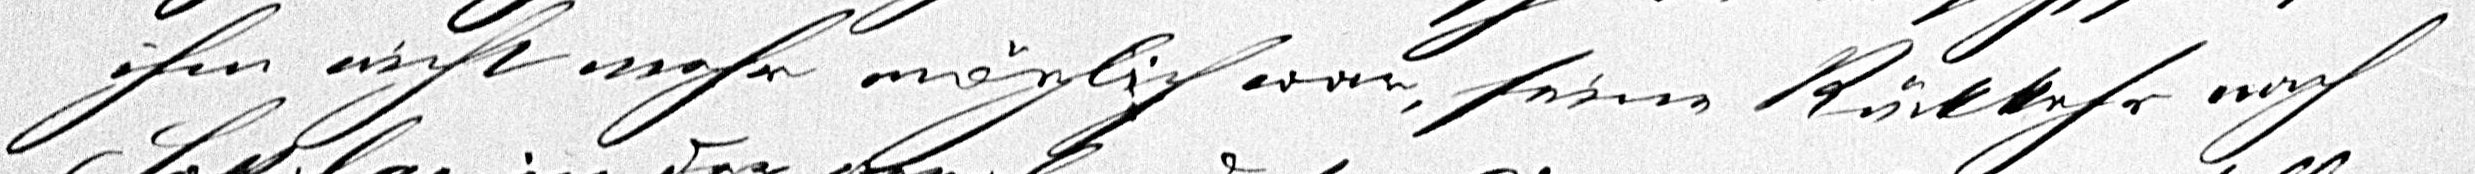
ihm nicht mehr möglich war, seine Rückkehr nach
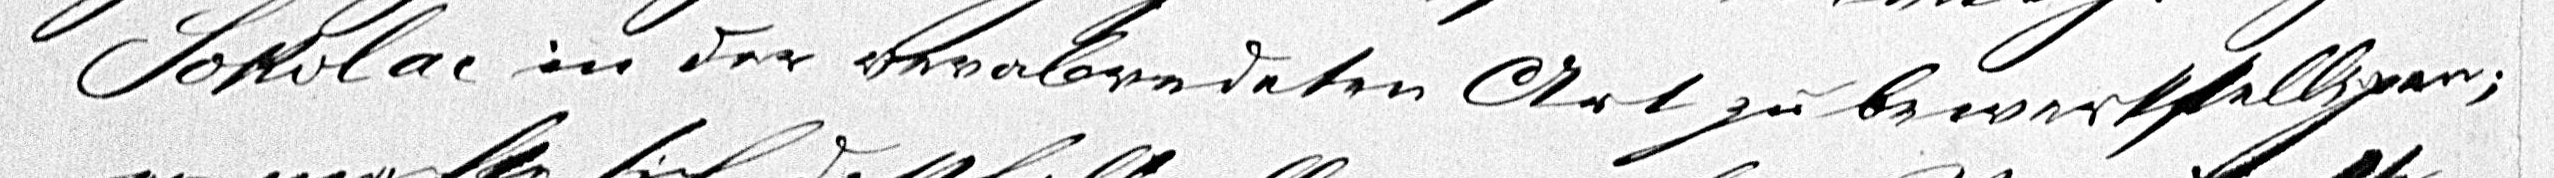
Sokolac in der verabredeten Art zu bewerkfellxx;
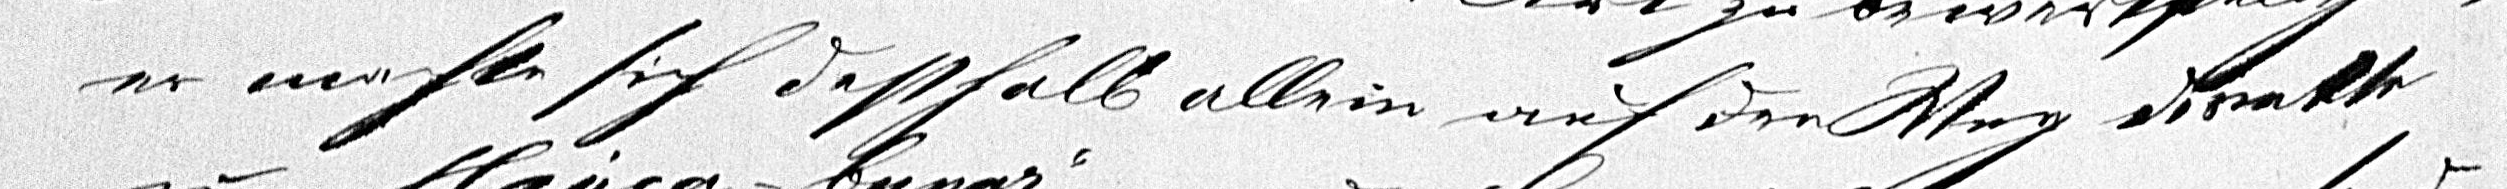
er machte sich deßhalb allein auf den Weg direkte
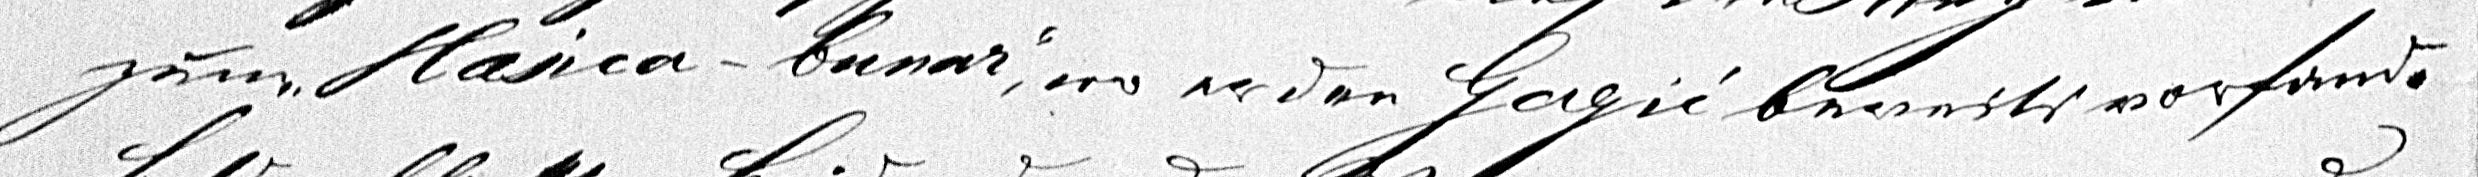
zum „Hasica-bunar“, wo er den Gagić bereits vorfand.
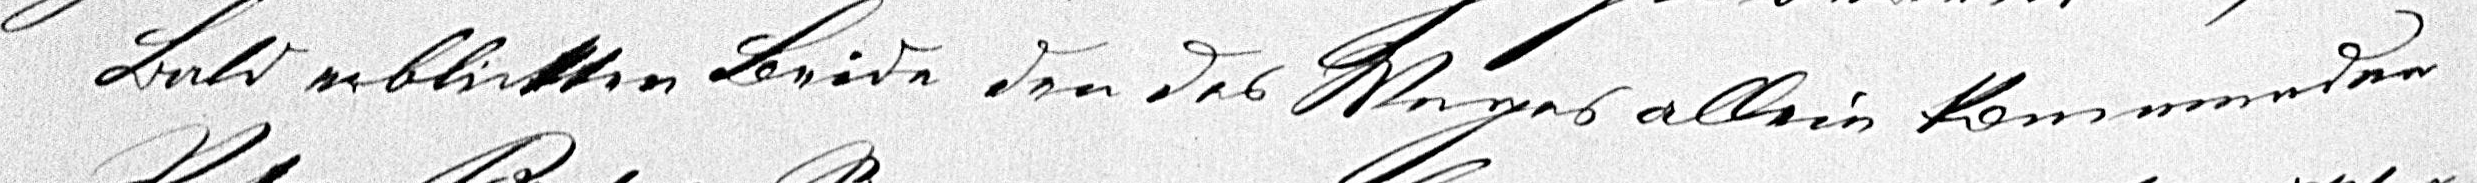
Bald erblickten Beide den des Weges allein kommenden
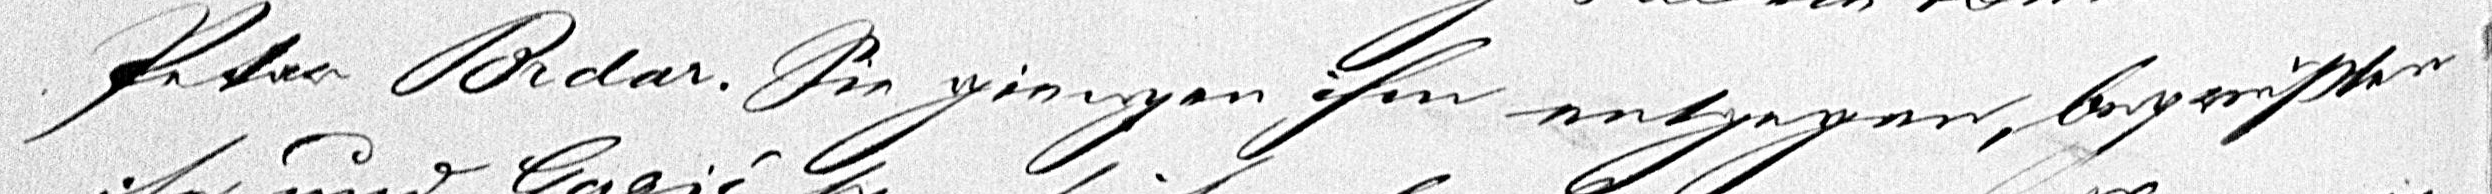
Petar Brdar. Sie gingen ihm entgegen, begrüßten
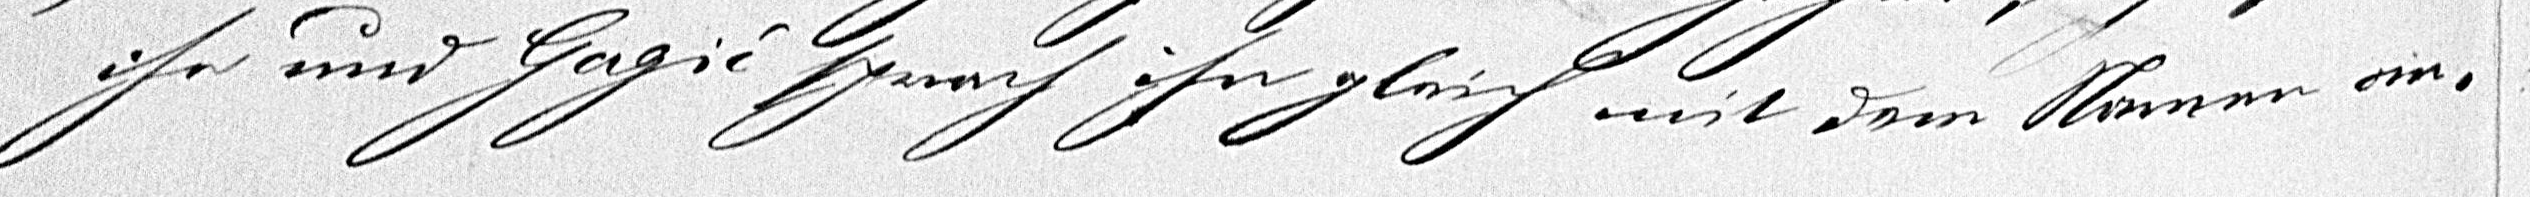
ihn und Gagić sprach ihn gleich mit dem Namen an.
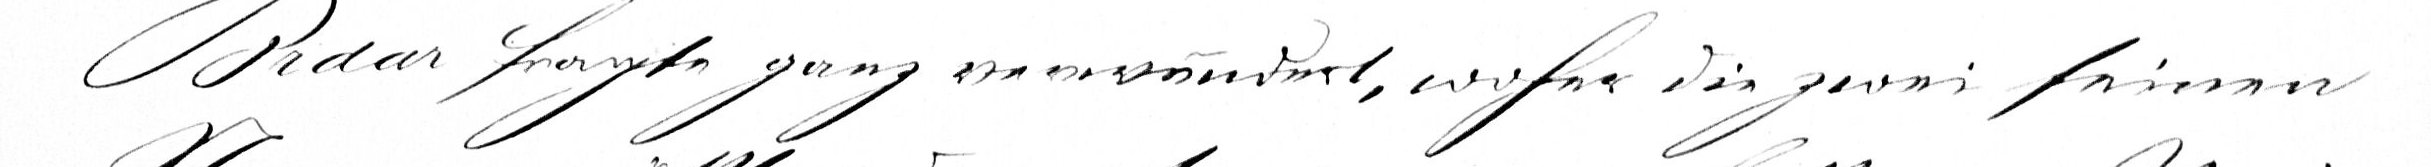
Brdar fragte ganz verwundert, woher die zwei seinen
